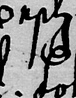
19.)
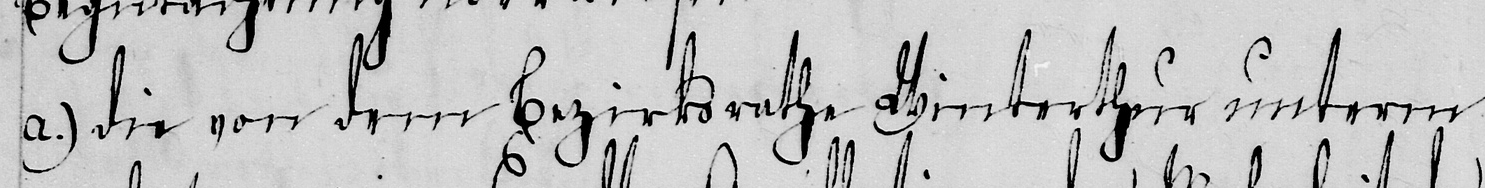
a.) die von dem Bezirksrathe Winterthur unterm
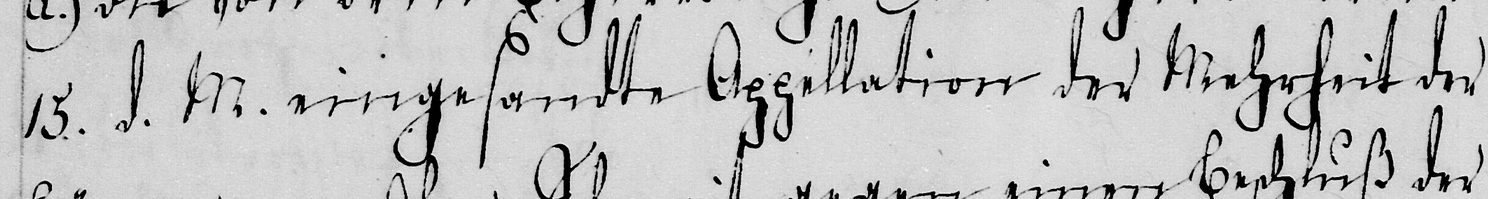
15. d. M. eingesandte Appellation der Mehrheit der
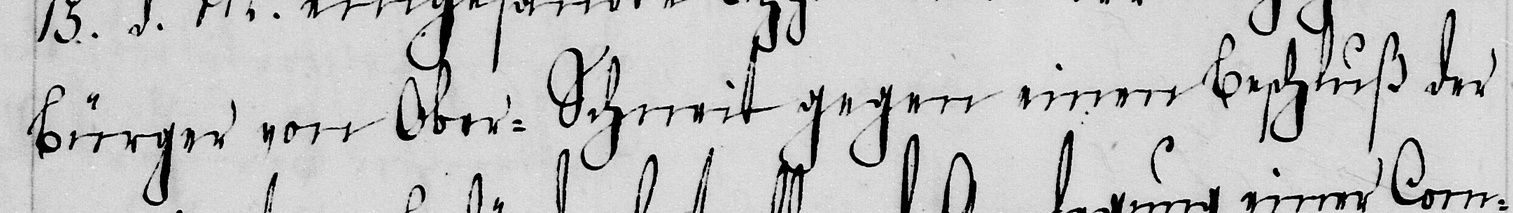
Bürger von Ober-Schneit gegen einen Beschluß der
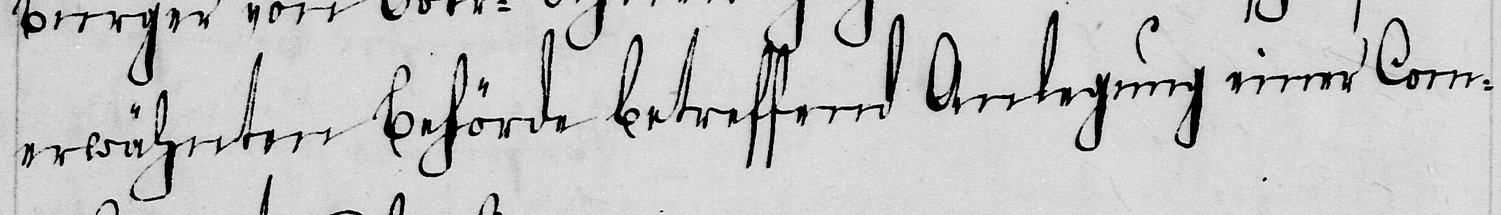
erwähnten Behörde betreffend Anlegung einer Com¬
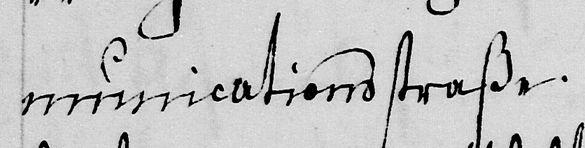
municationsstraße.
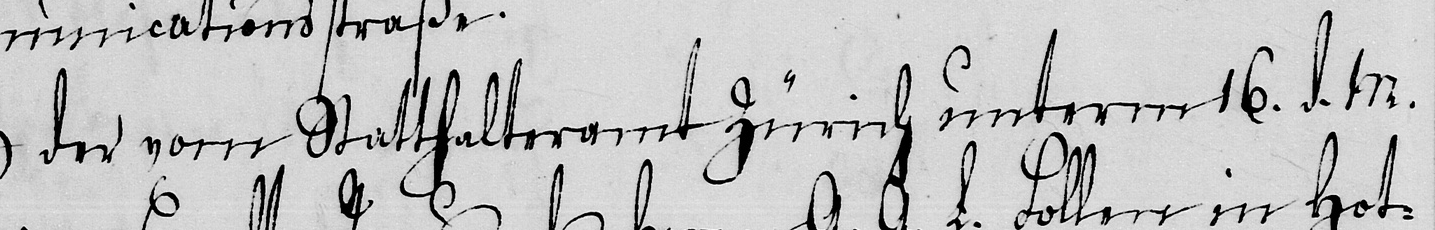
der vom Statthalteramt Zürich unterm 16. d. M.
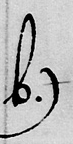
H.
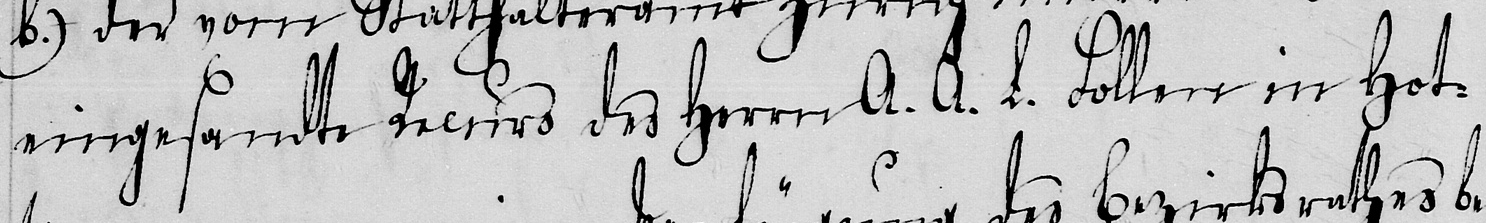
eingesandte Recurs des Herrn A. A. L. Follen in Hot¬
